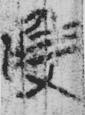○（獲）
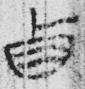貞
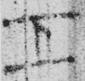工（功）
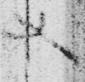又（有）
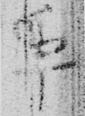孚
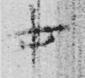才（在）
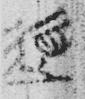道
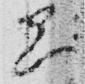已
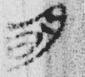明
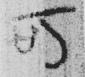可（何）
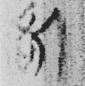咎
